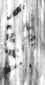事
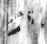大
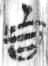吉
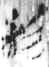利（利）
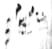於
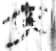內（納）
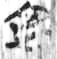室
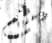㠯（以）
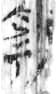祭
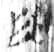門
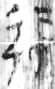行
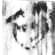亯（享）
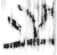之
